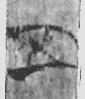五
